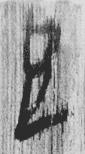也
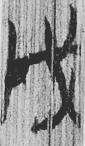戊
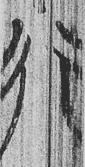行
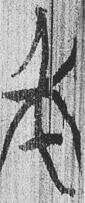年
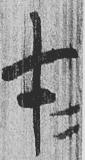七十
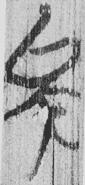矣
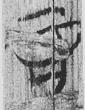言
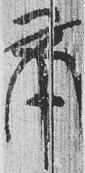不
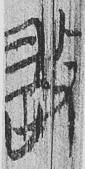敢
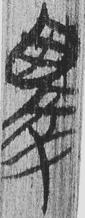睪
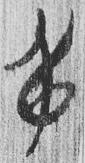身
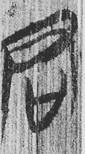君
